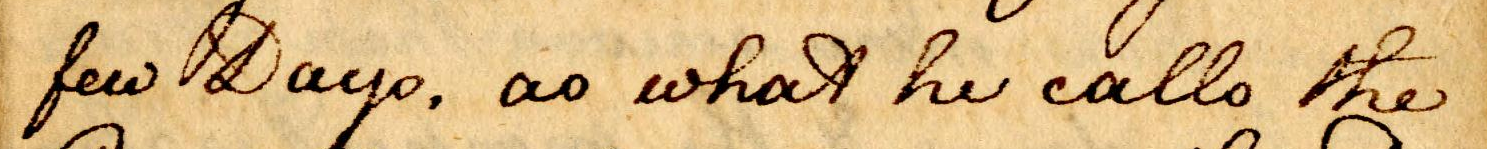few Days, as what he calls the
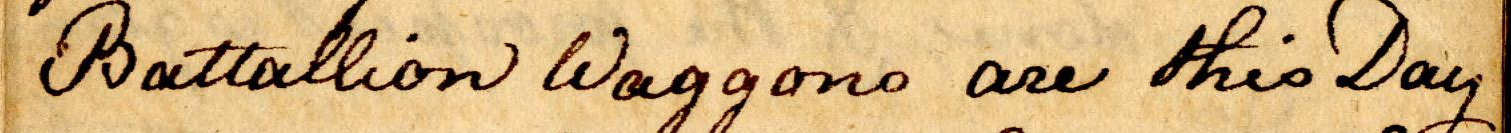Battallion Waggons are this Day
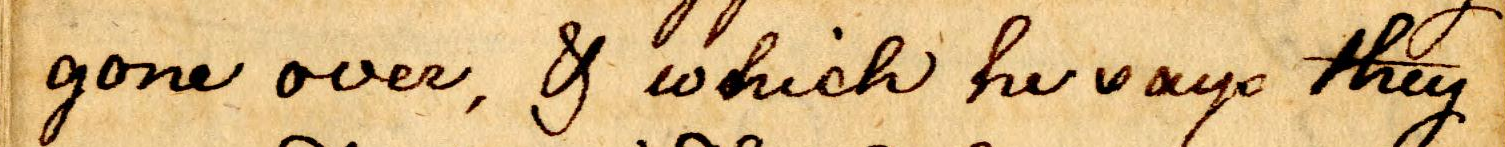gone over, & which he says they
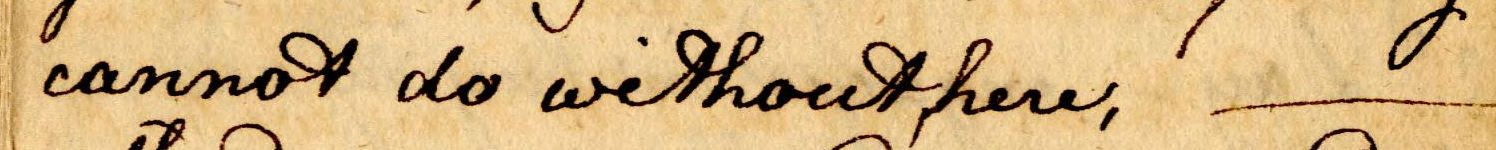cannot do without here,-
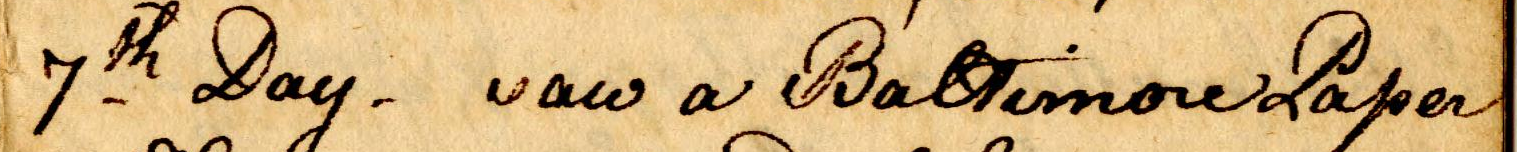7^th Day- saw a Baltimore Paper
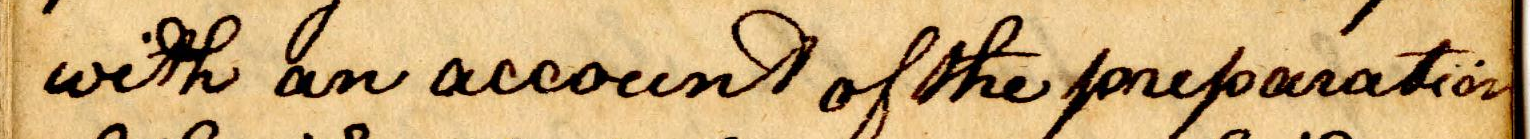with an account of the preparation
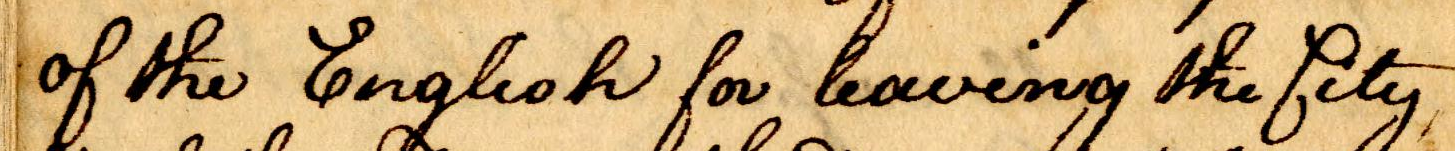of the English for leaving the City
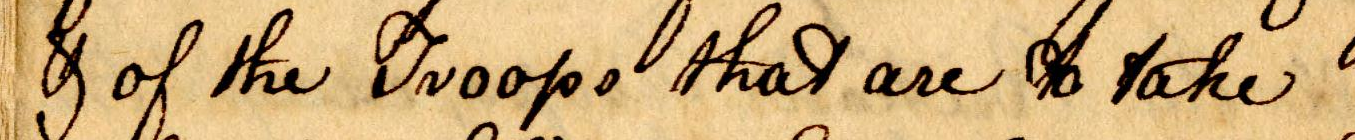& of the Troops that are to take
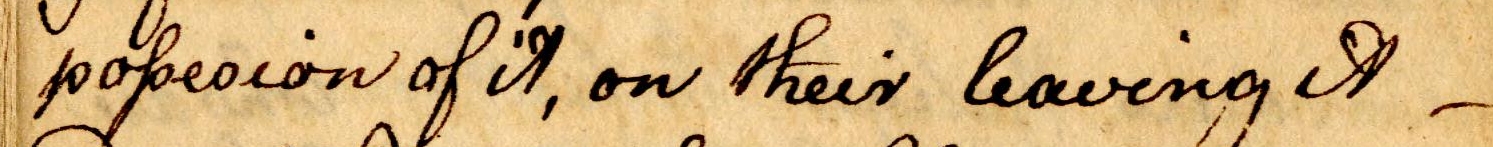possesion of it, on their leaving it
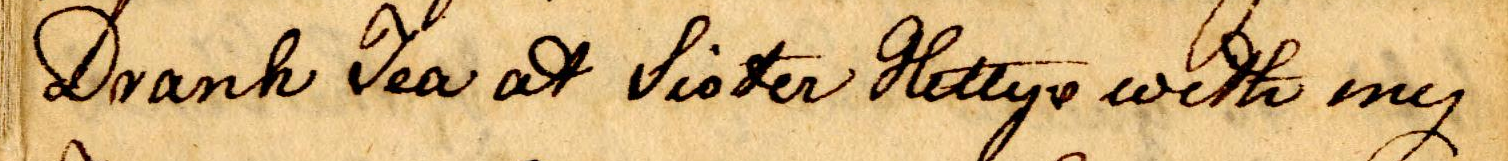Drank Tea at Sister Hettys with my
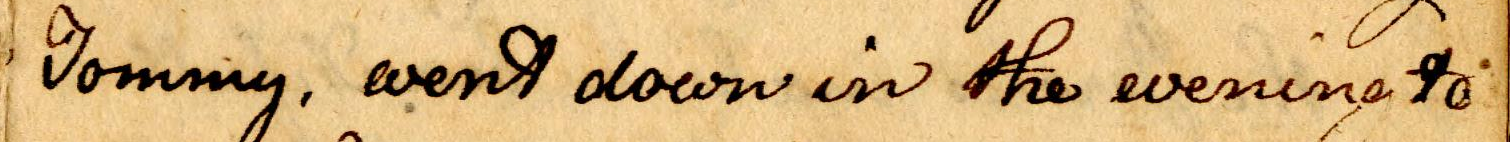Tommy, went down in the evening to
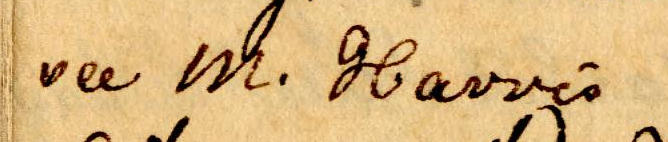see M. Harris
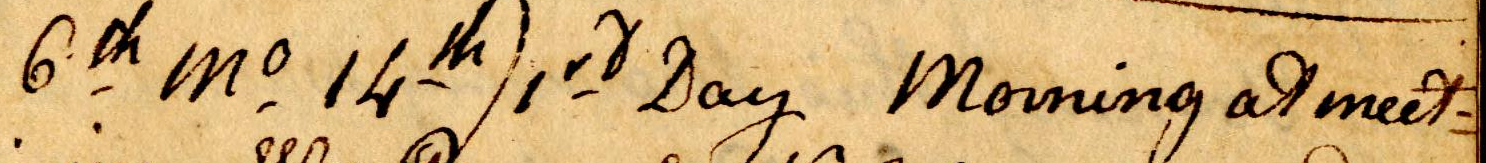6^th M^o. 14^th) 1^st Day. Morning at meet-
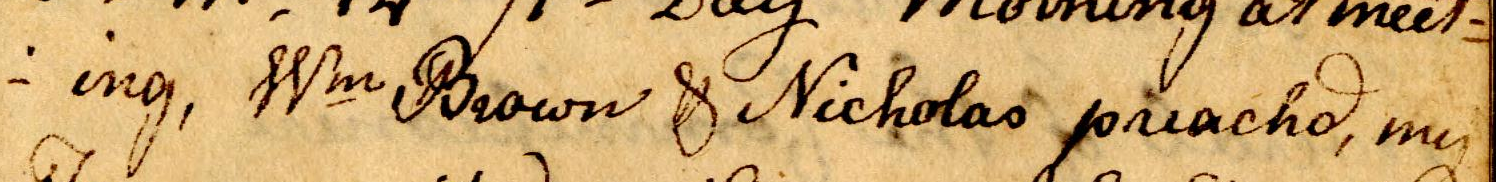-ing, W^m Brown & Nicholas preachd, my
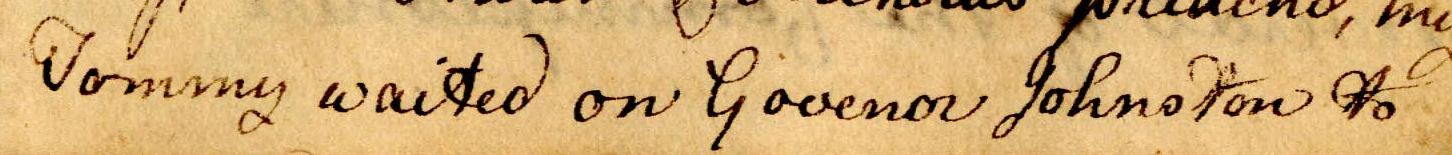Tommy waited on Govenor Johnston to
